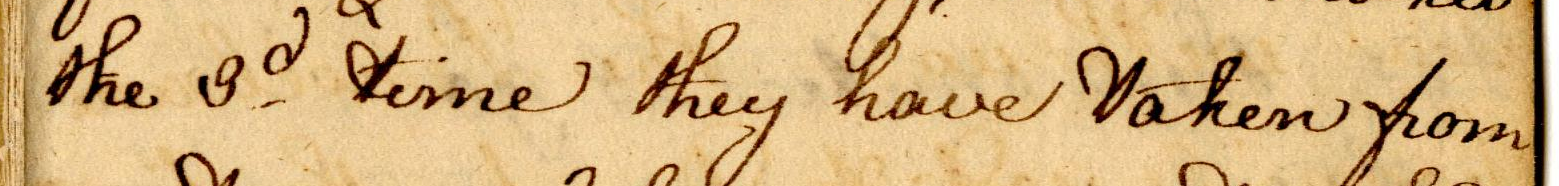the 3^d time they have taken from
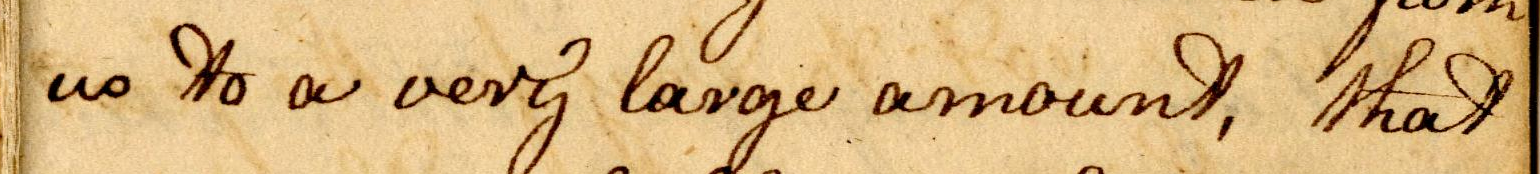us to a very large amount, that
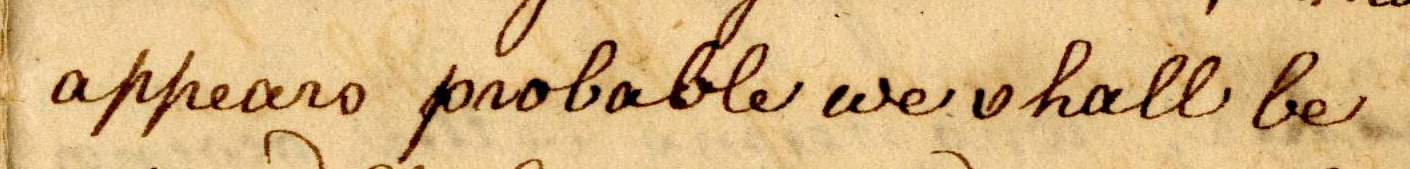appears probable we shall be
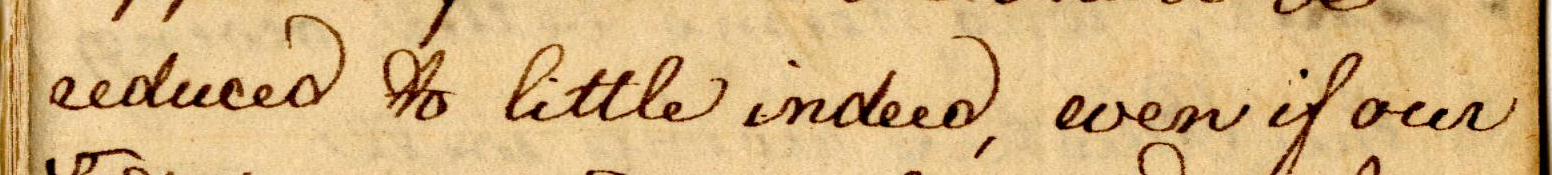reduced to little indeed, even if our
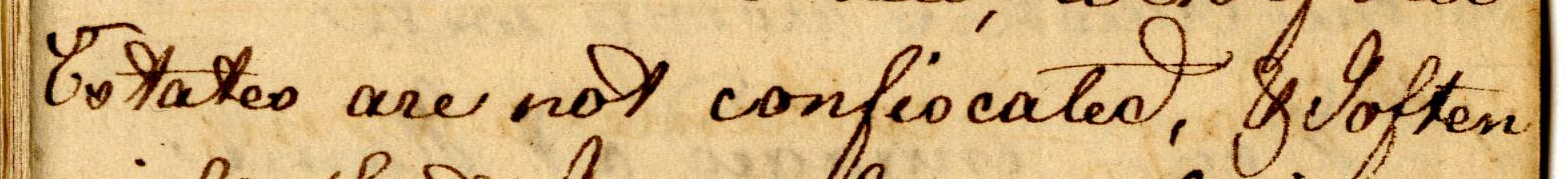Estates are not confiscated, & I often
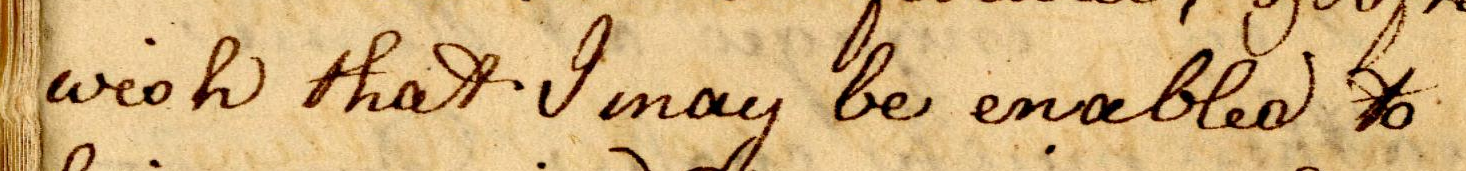wish that I may be enabled to
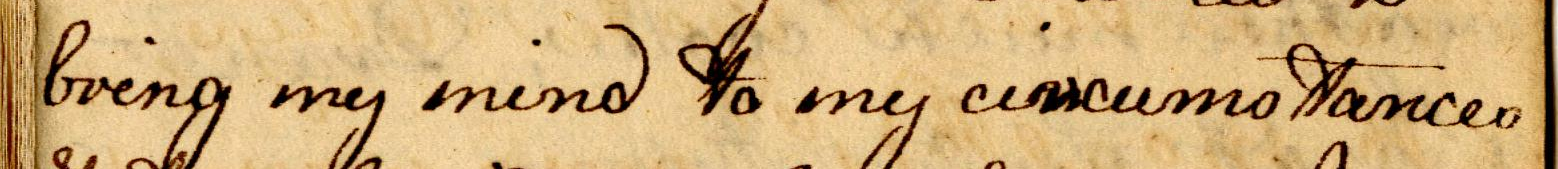bring my mind to my circumstances
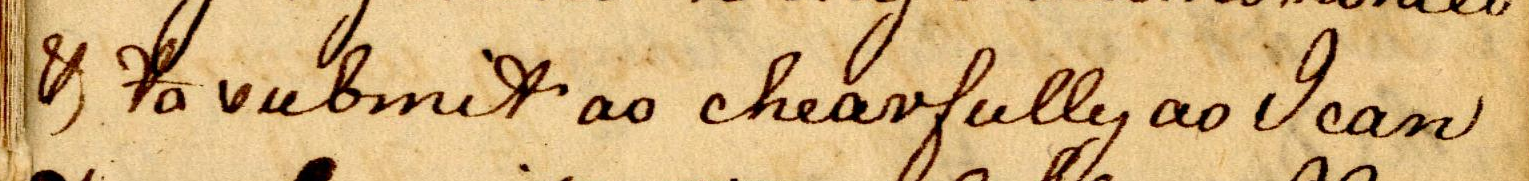& to submit as chearfully as I can
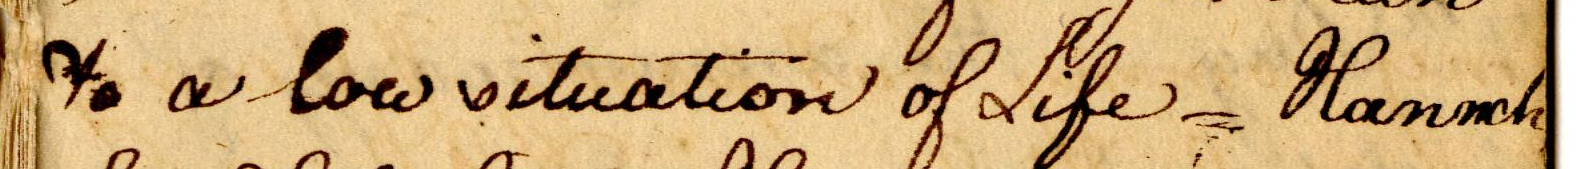to a low situation of Life- Hannah
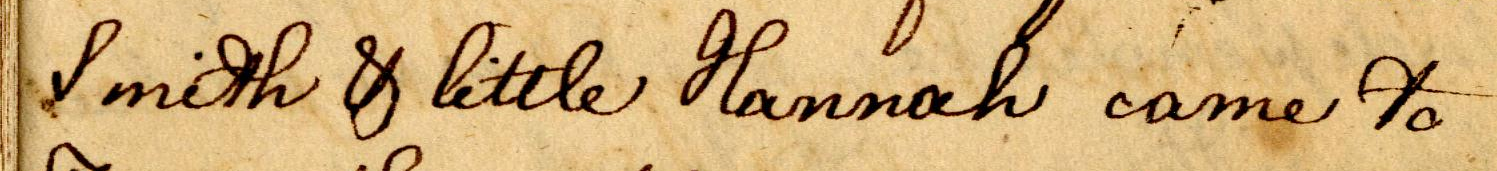Smith & little Hannah came to
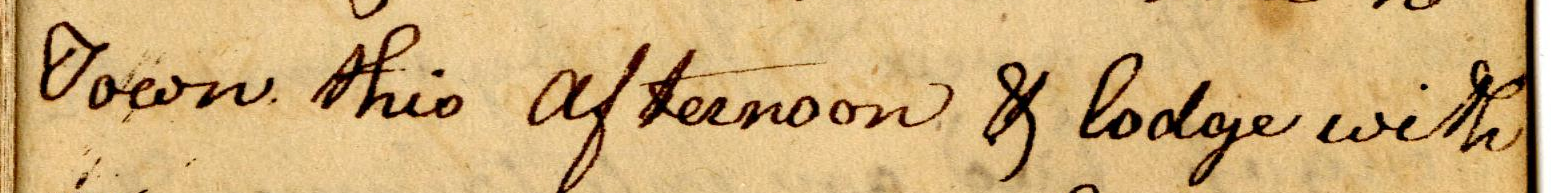Town this Afternoon & lodge with
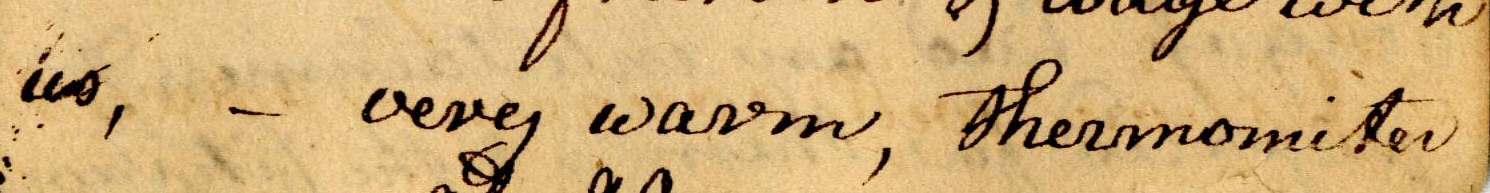us, - very warm, thermomiter
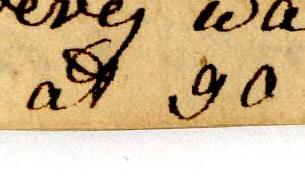at 90
